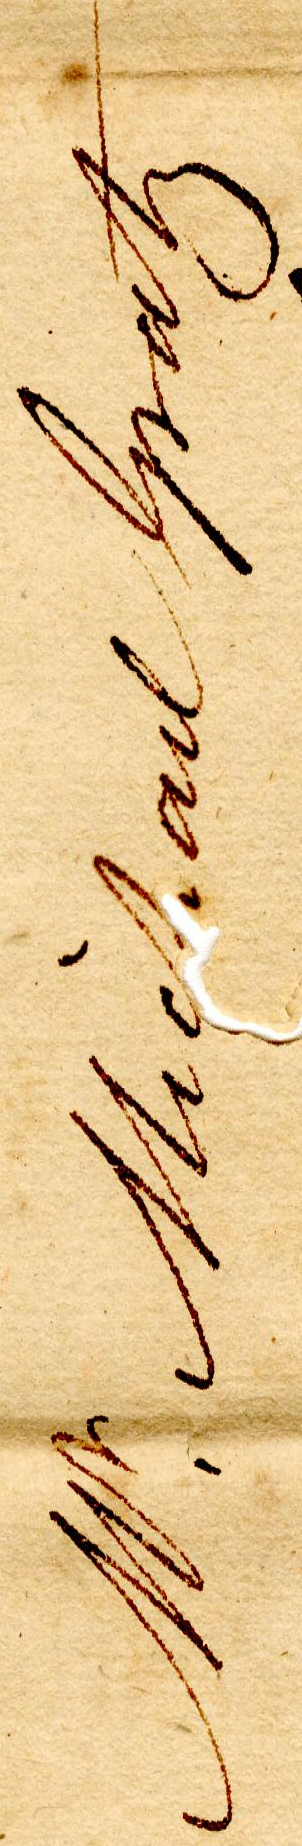M^r Michael Gratz
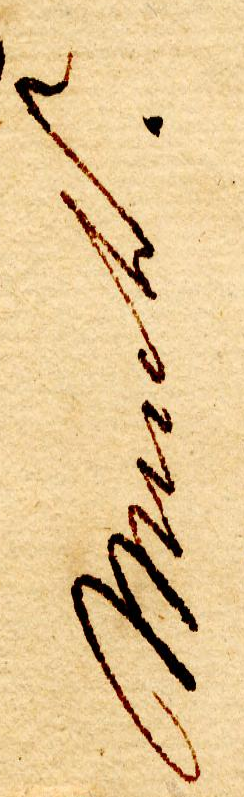Merch^t
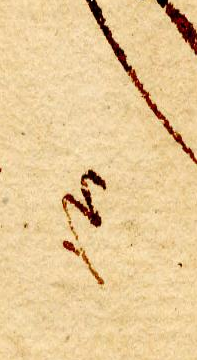in
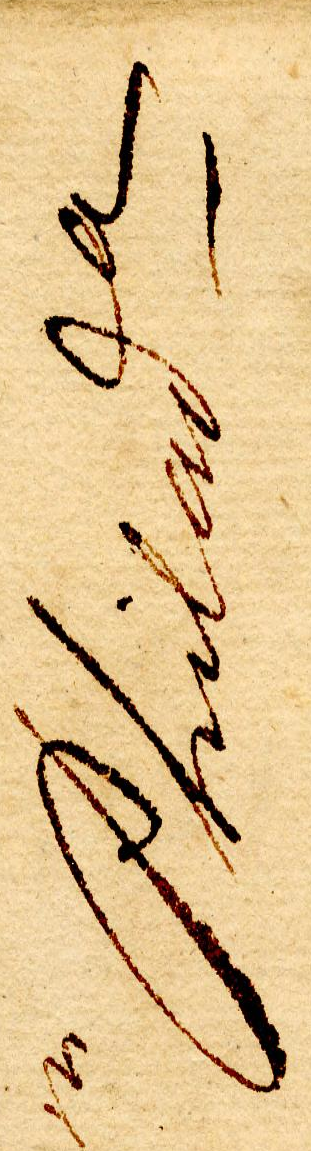Philad^a
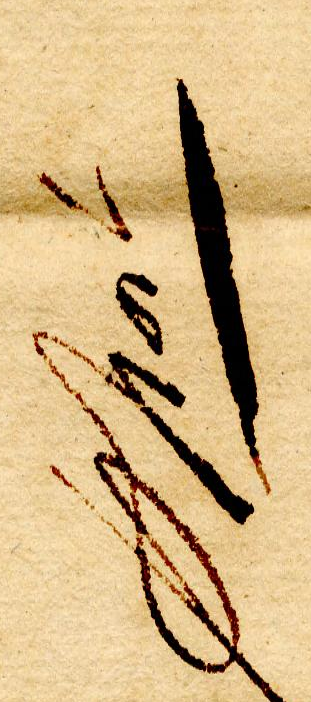per Post
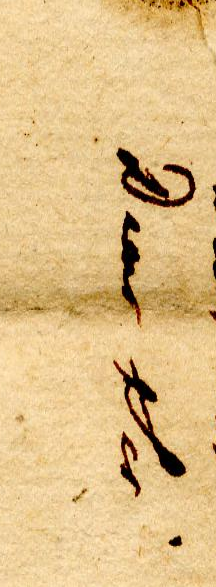Dear Sir
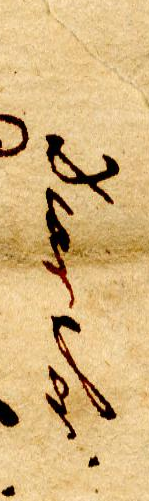Dear Sir
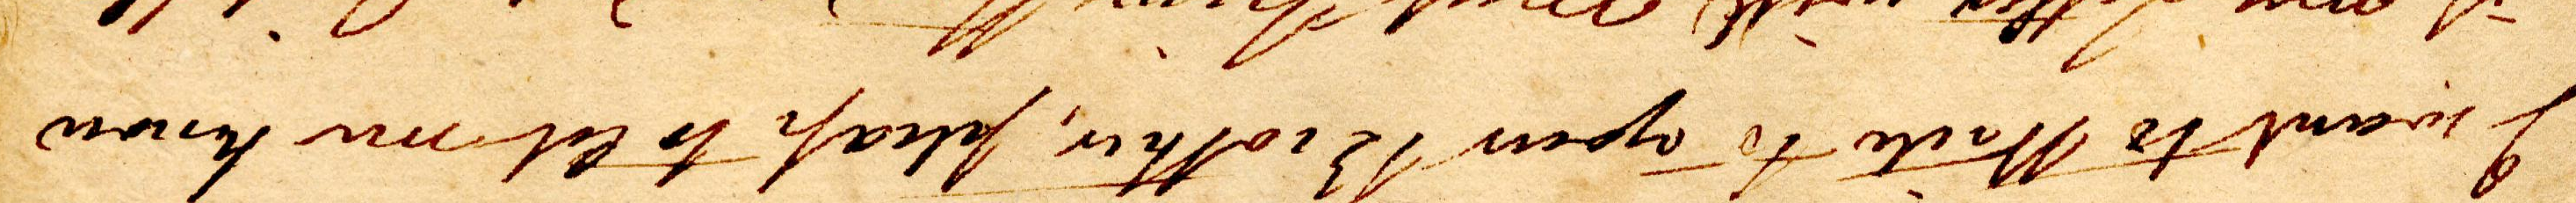I want to write to your Brother, please to let me know
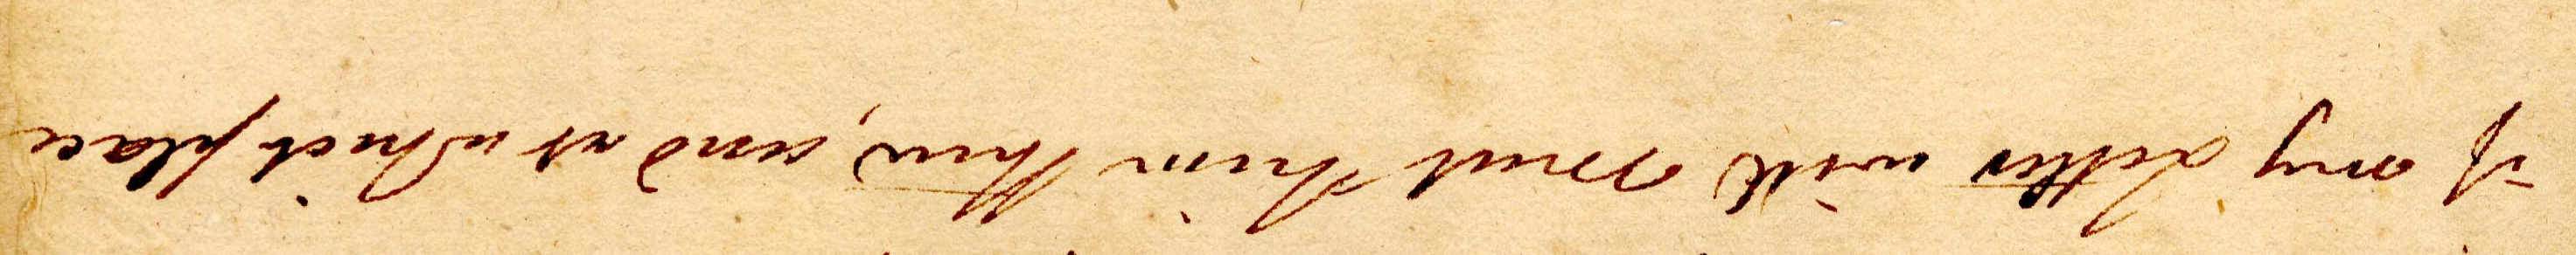if my letter will miss him there and at which place
